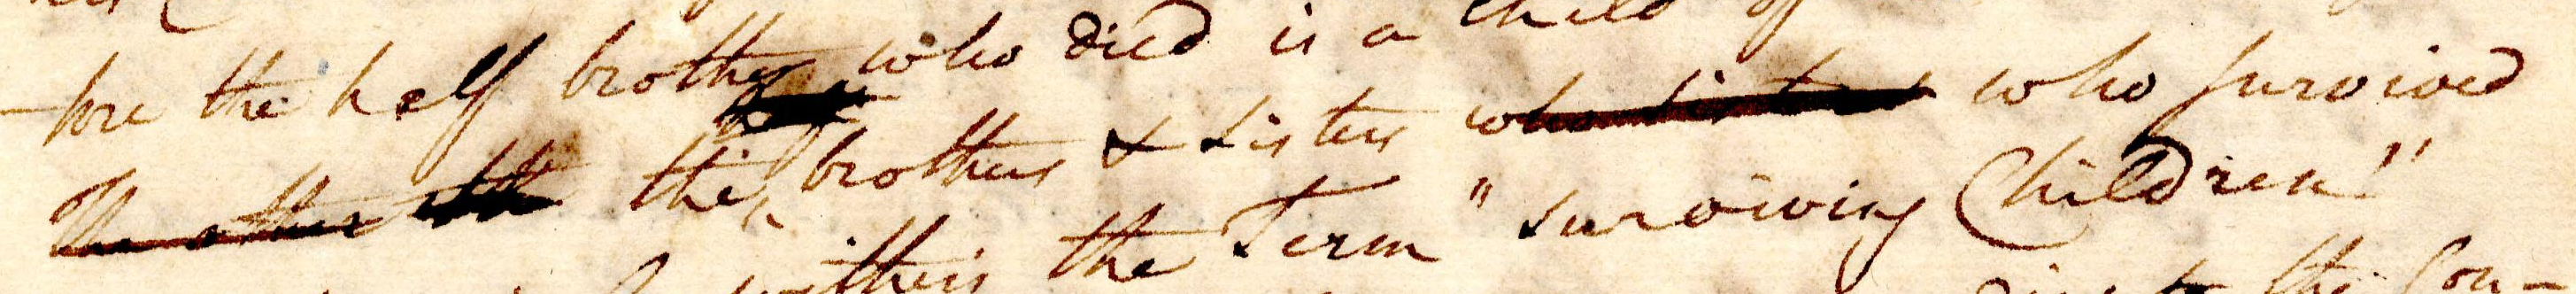[The other] [___] the brothers & Sisters [_________] who survived
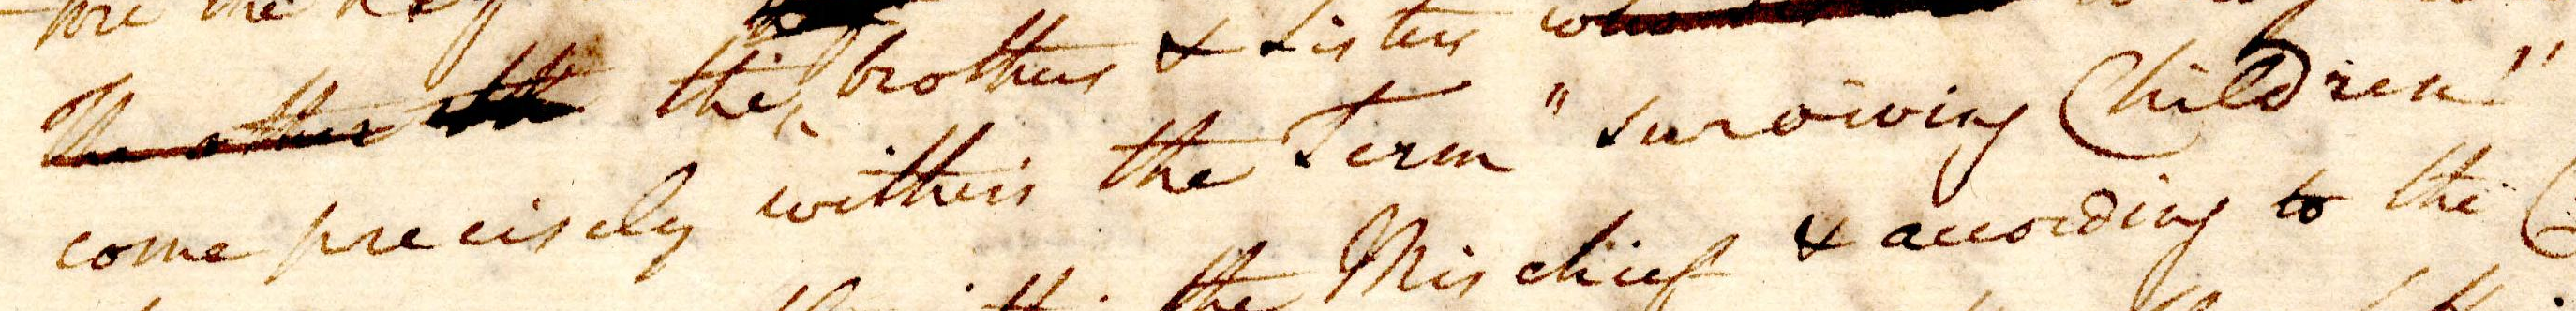come precisely wither the Term surviving Children"
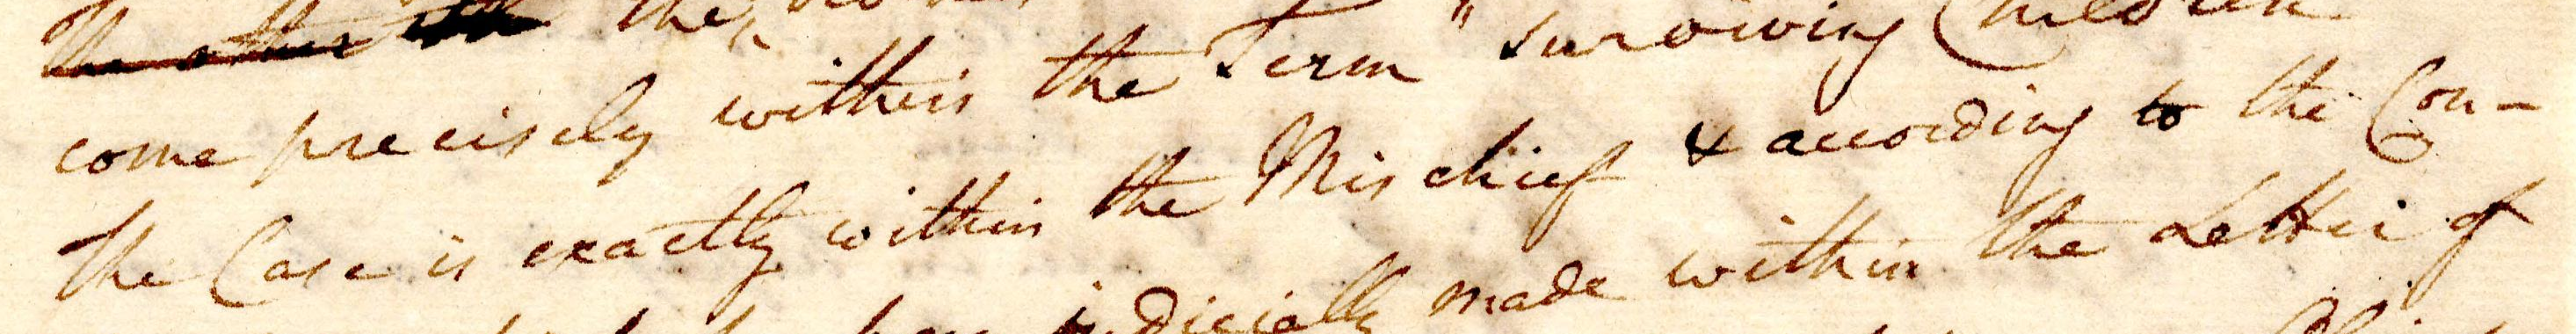The Case is exactly within the Mischief & according to the Con-
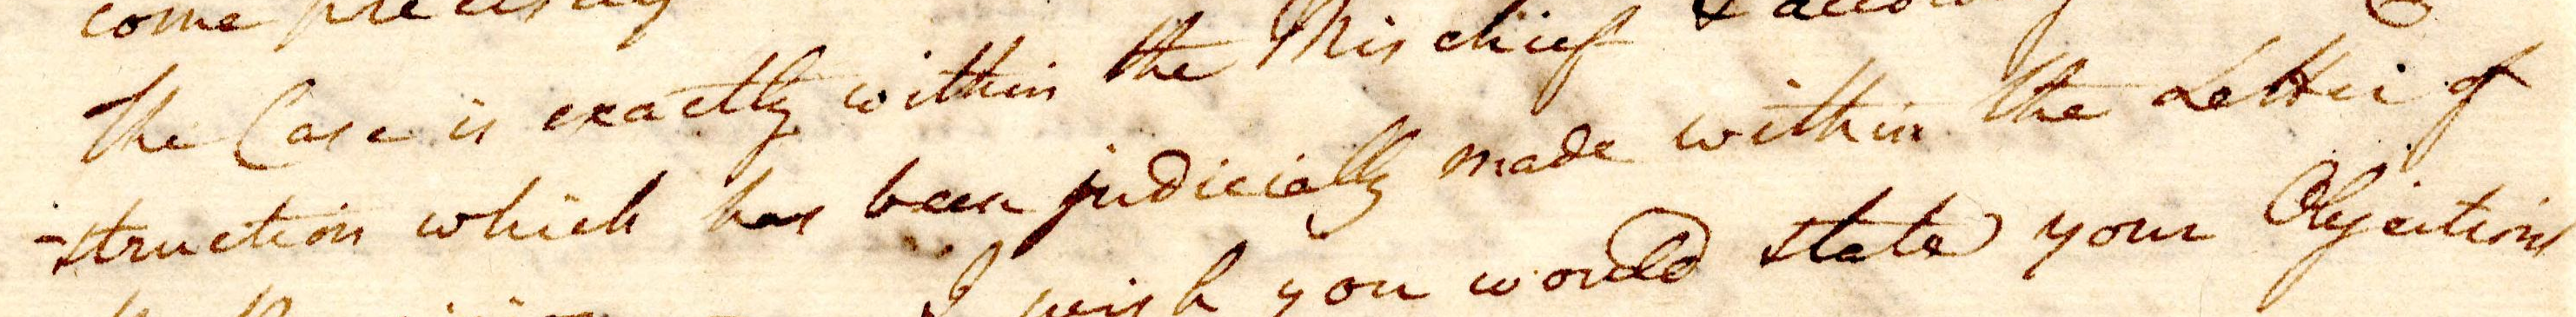-struction which has been judicially made within the Letter of
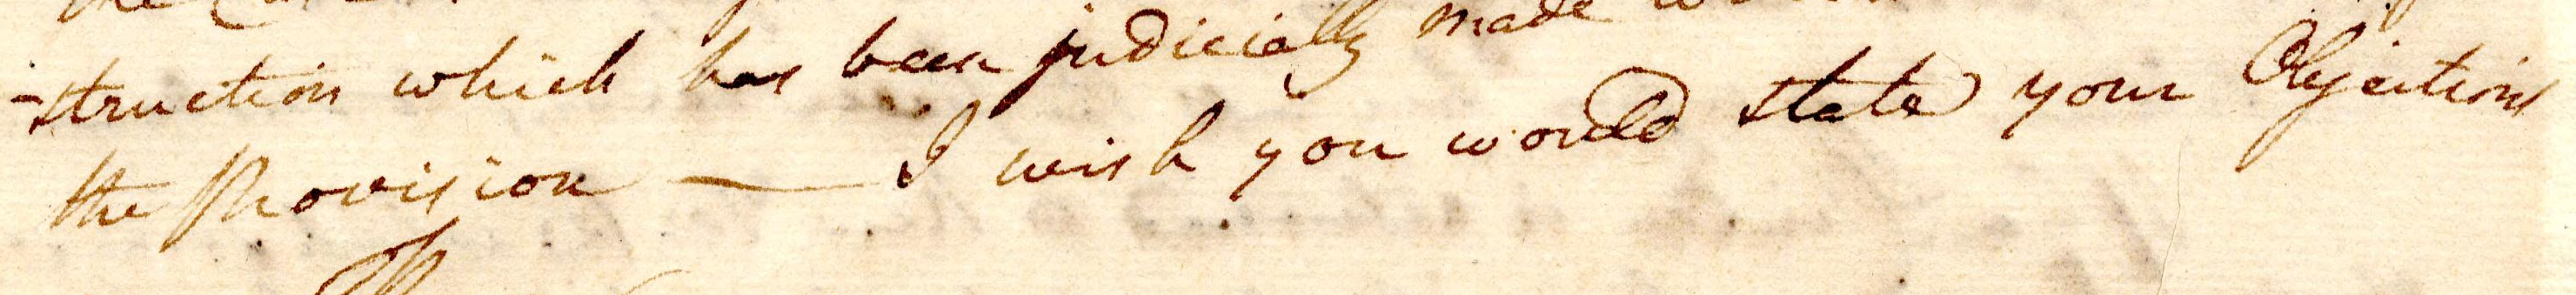the Provision. I wish you would state your Objections
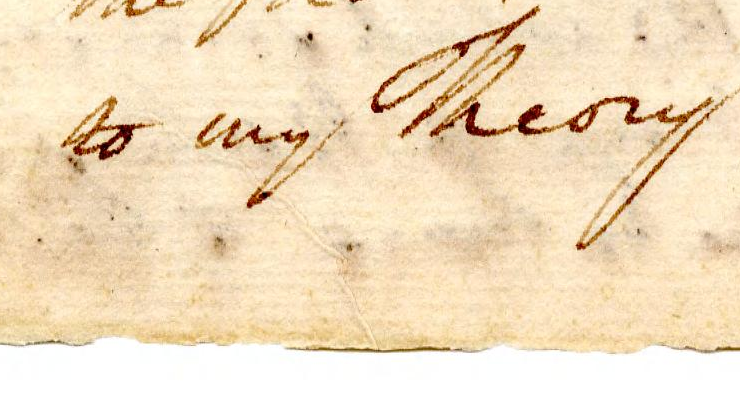to my Theory.
